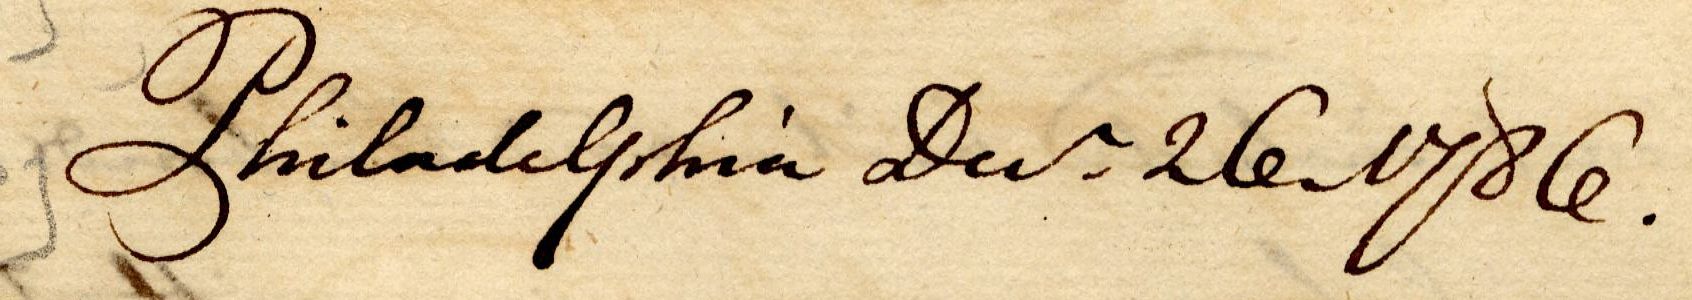Philadelphia Dec^r. 26 1786.
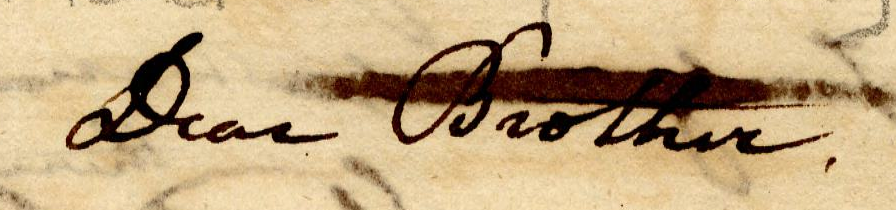Dear Brother
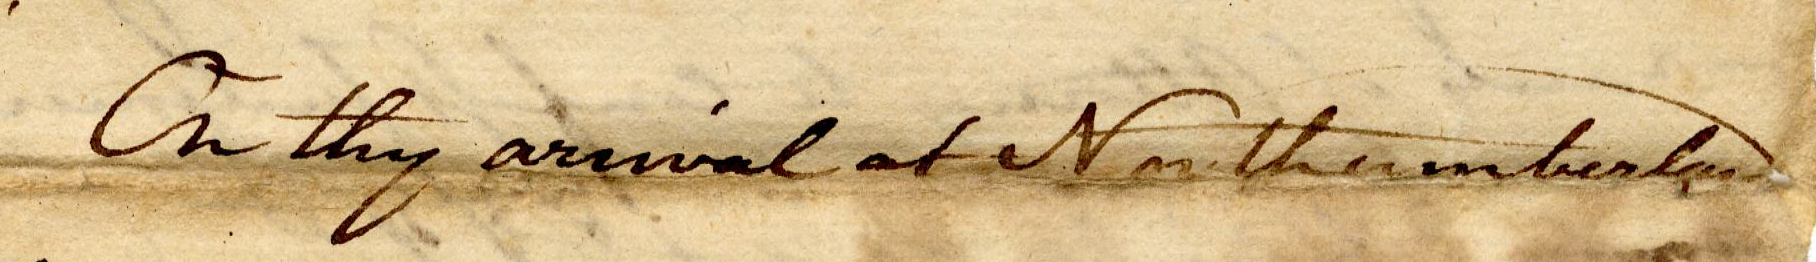On thy arrival at Northumberland
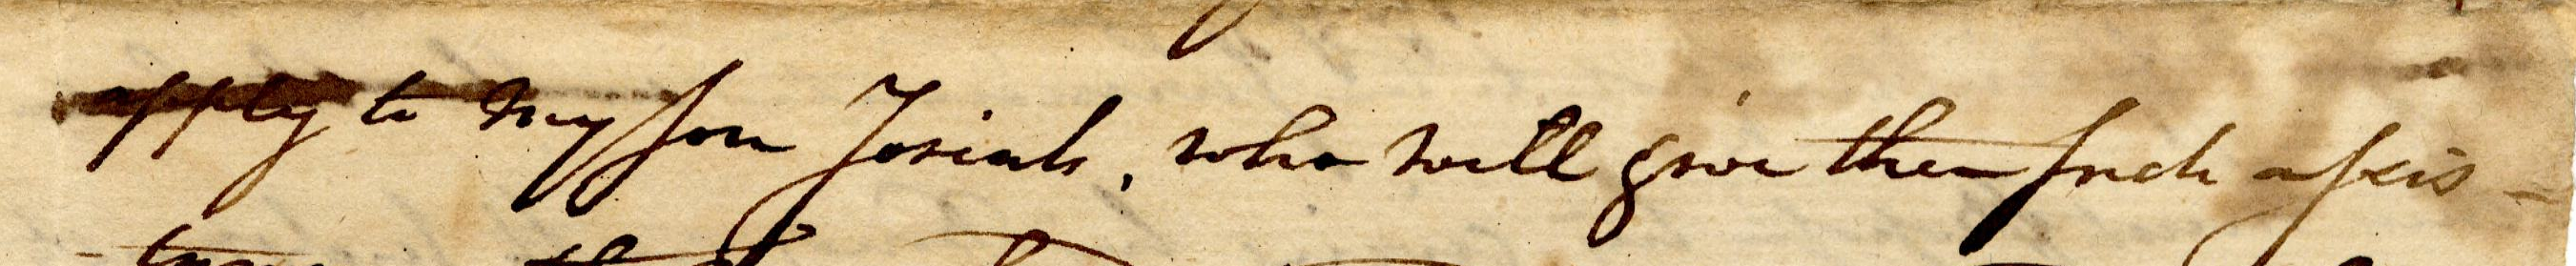apply to thy son Josiah, who will give thee such assis-
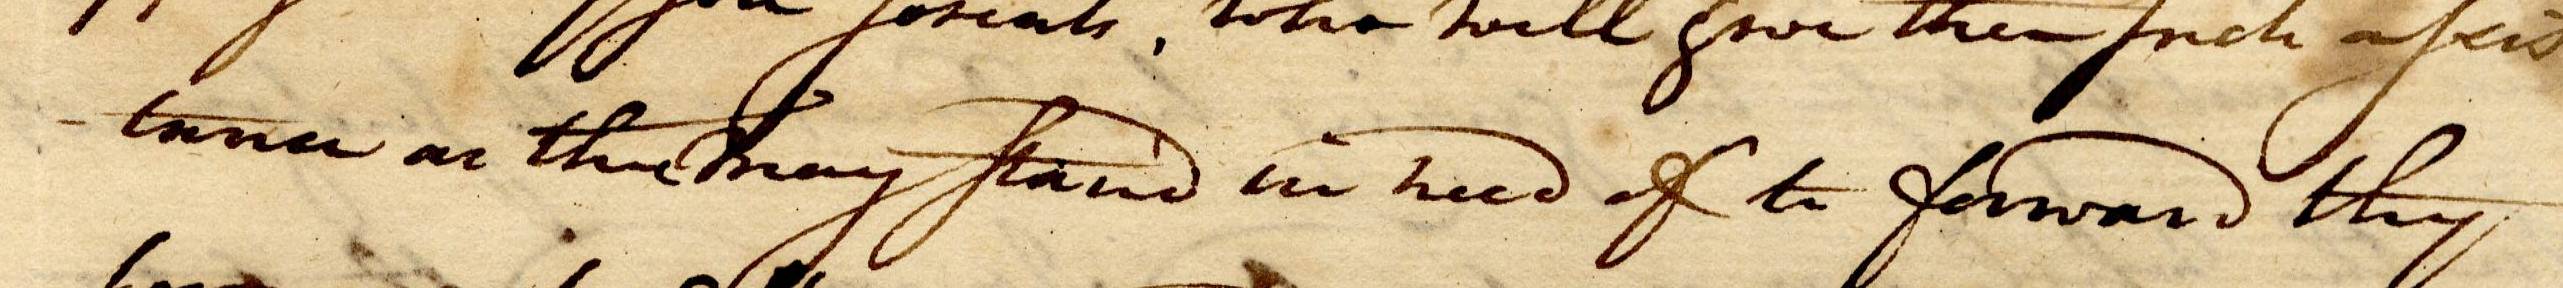-tance as the may stand in need of to forward thy
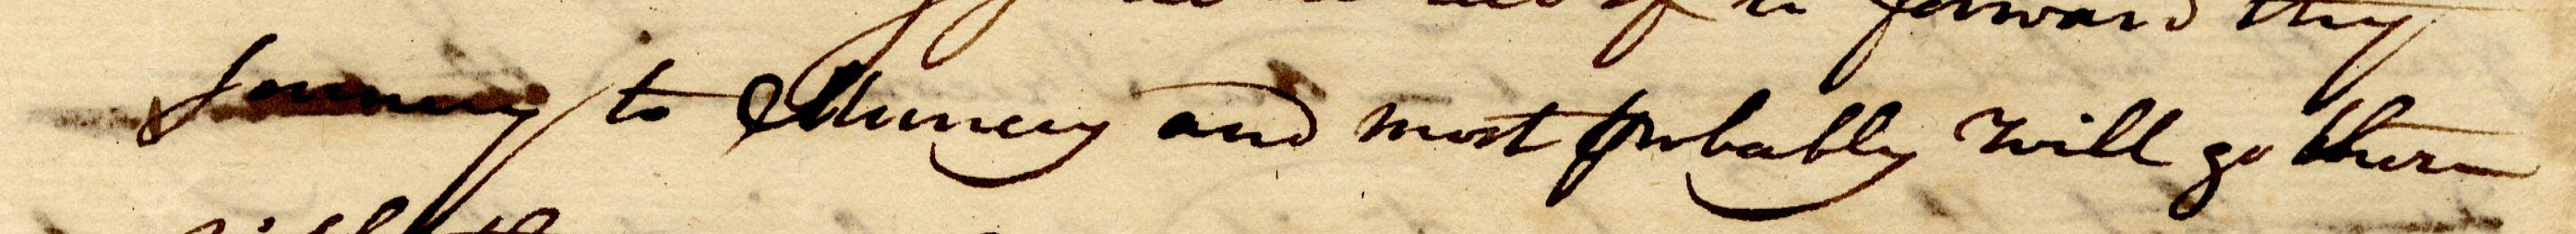J[ourney] to Iluncey and most probably will go there
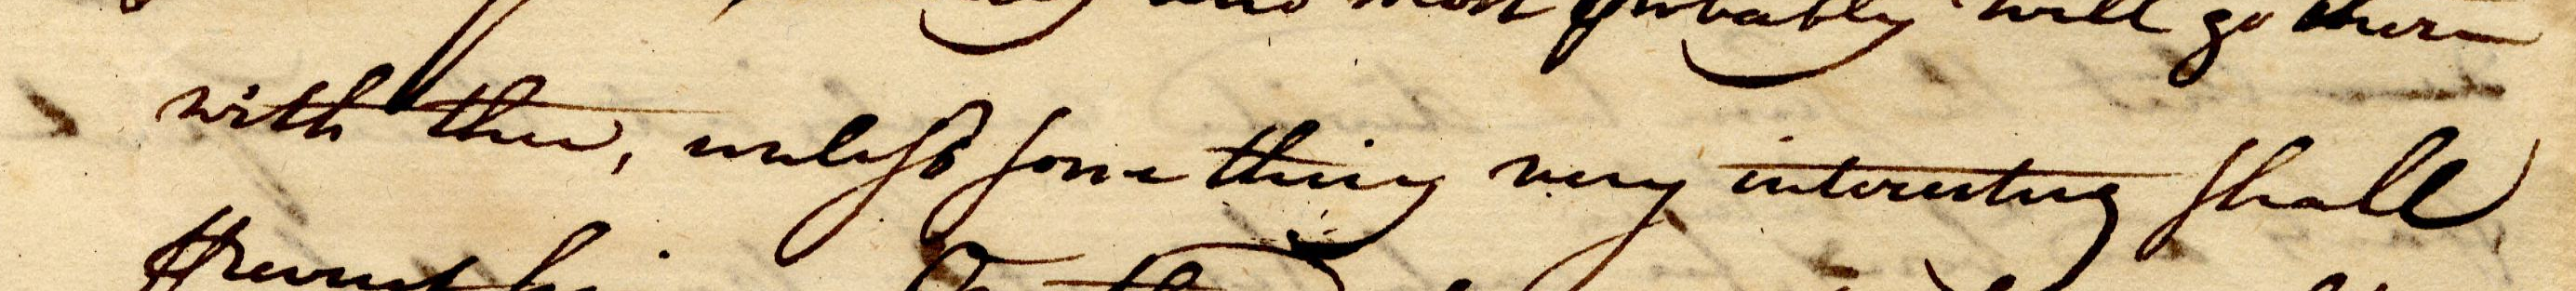with thee, unless some thing very interesting shall
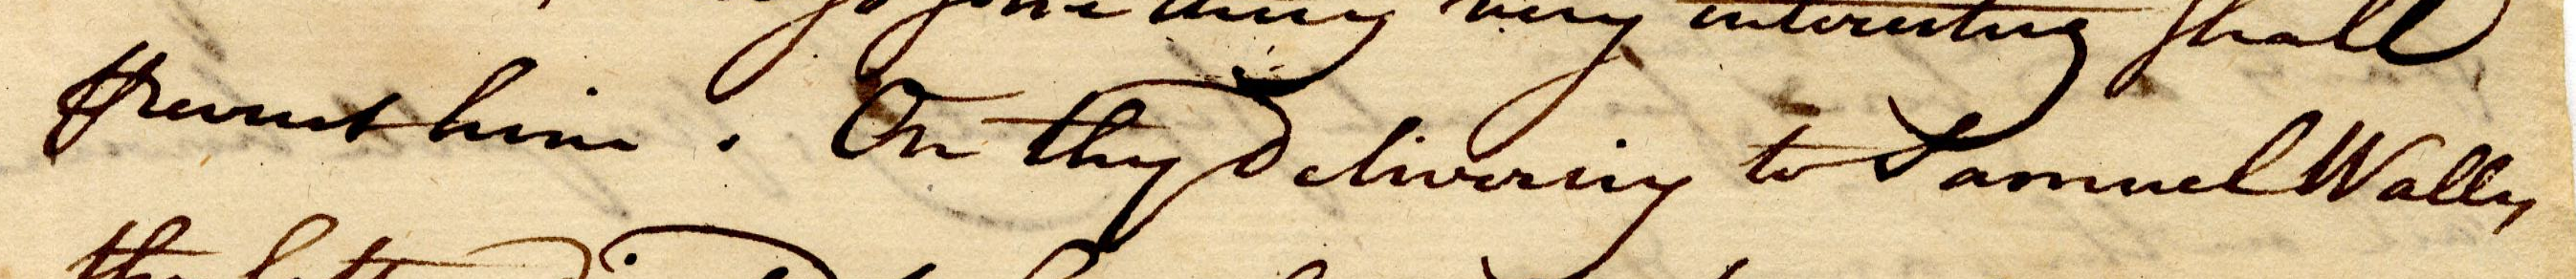prevent him. On thy delivering to Samuel Wally
